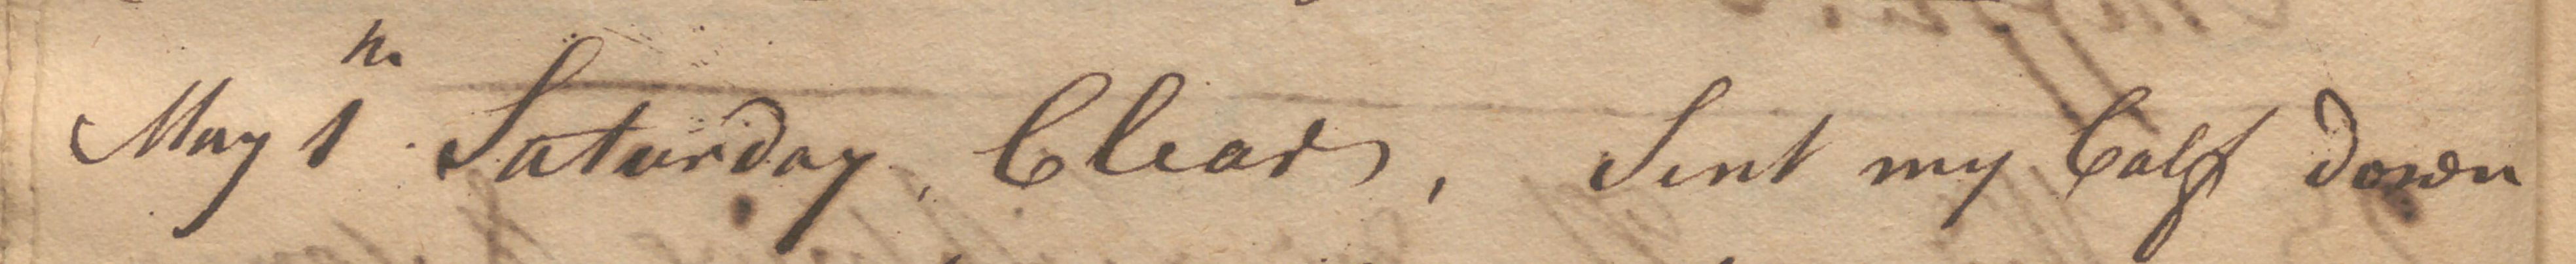May 1^th Saturday, Clear, Sent my Calf down
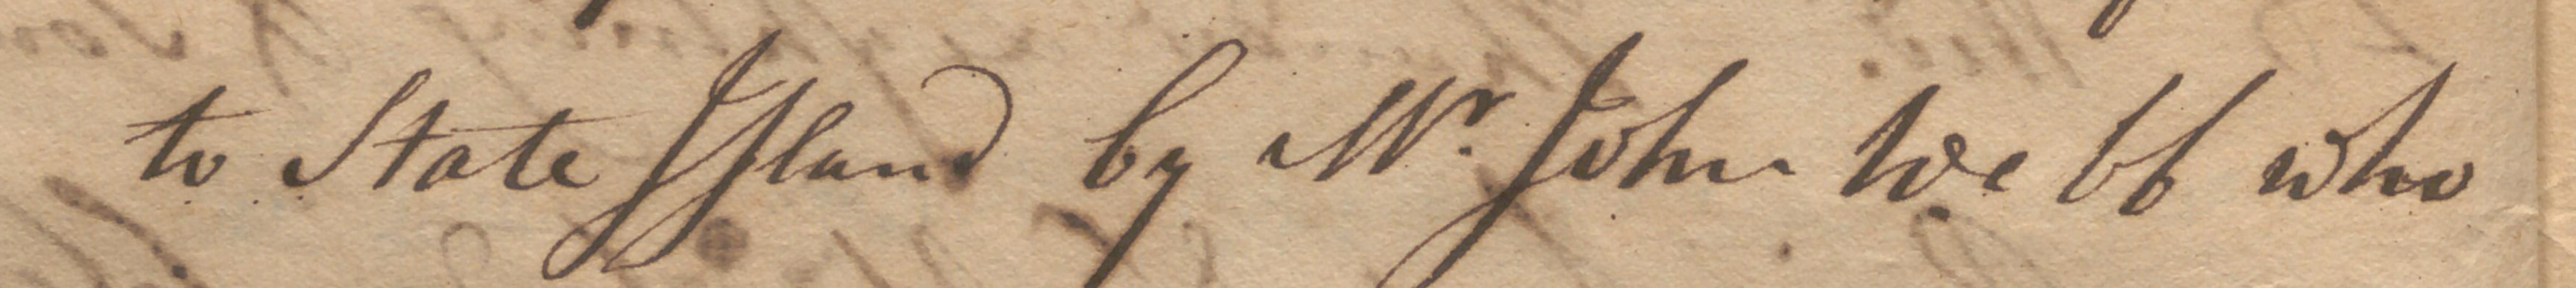to State Island by M^r. John Webb who
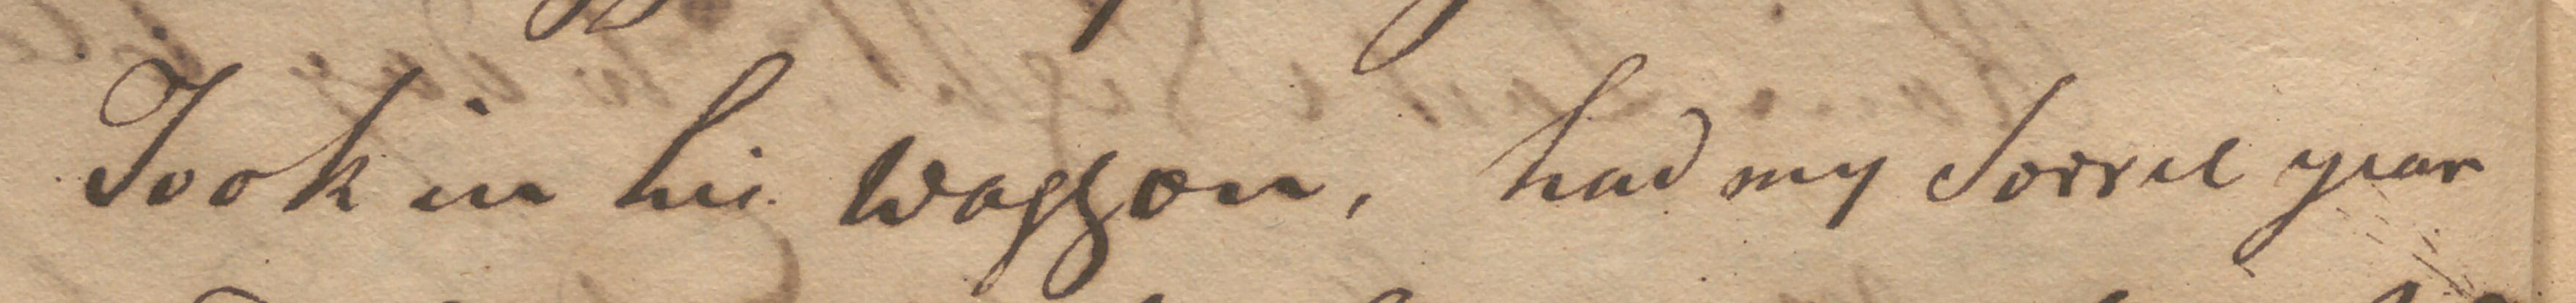Took in his waggon, had my Sorrel year
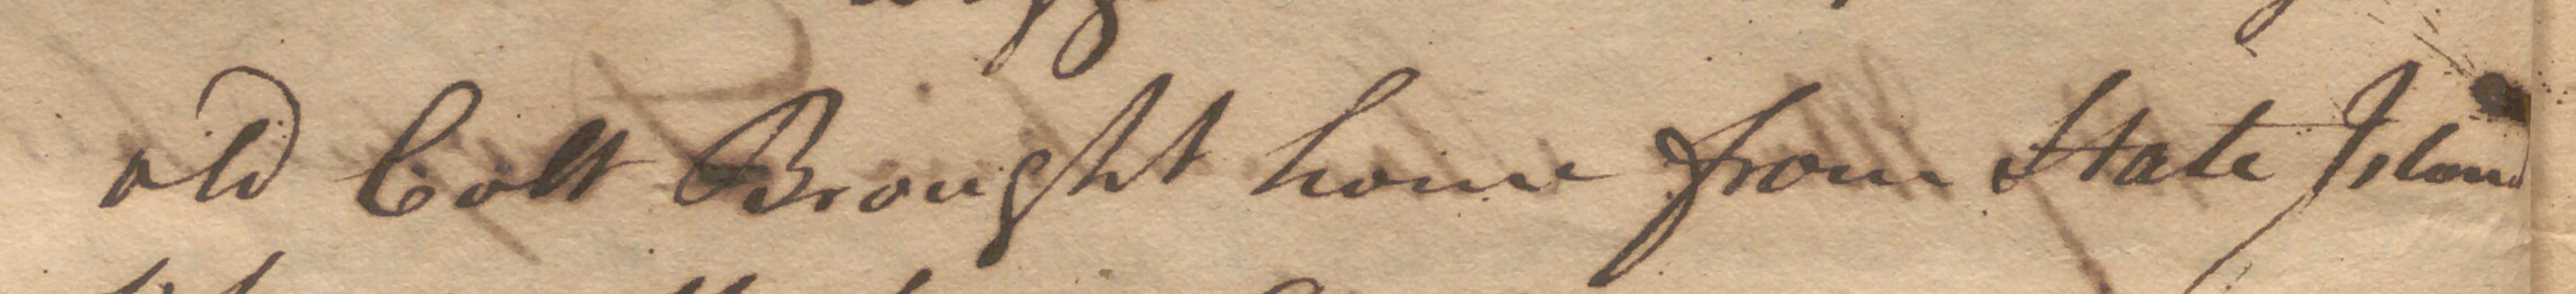old Colt Brought home from State Island
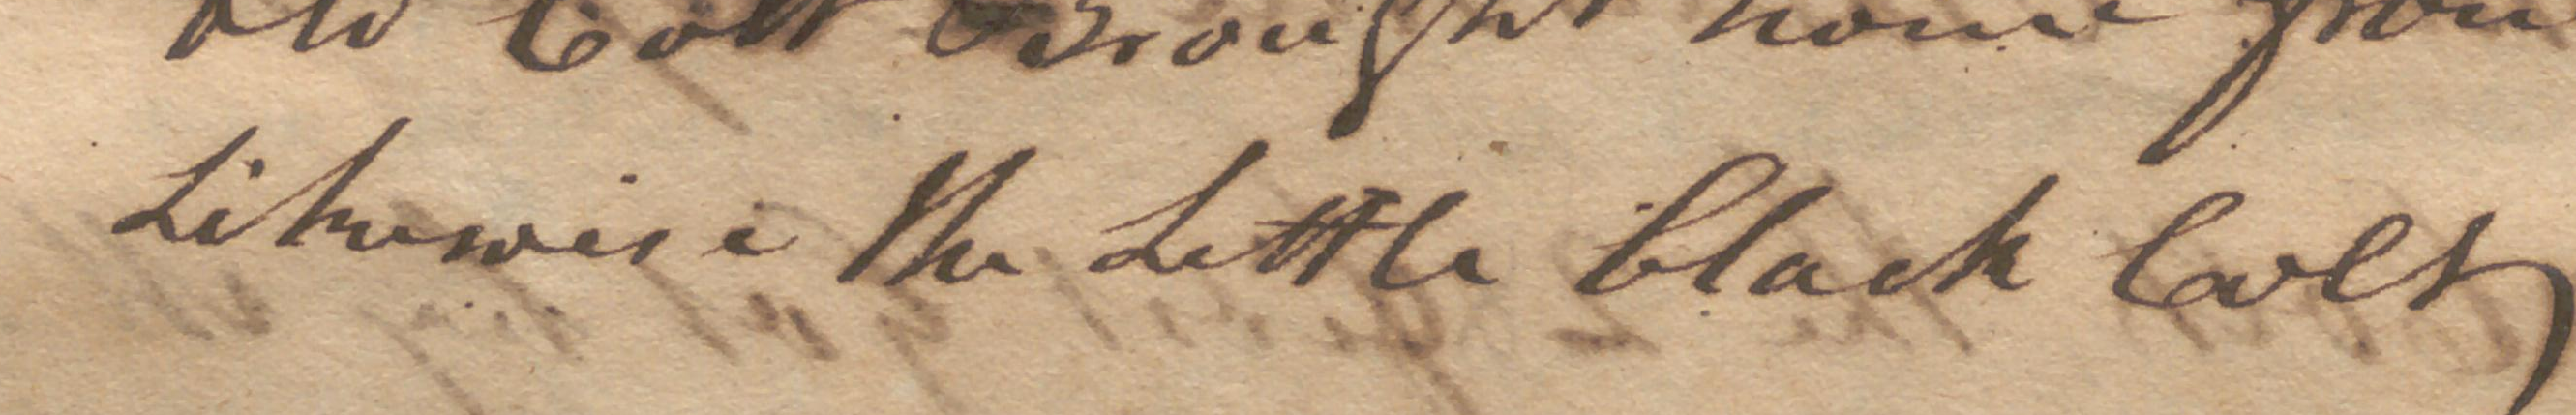Likewise the Little black Colt
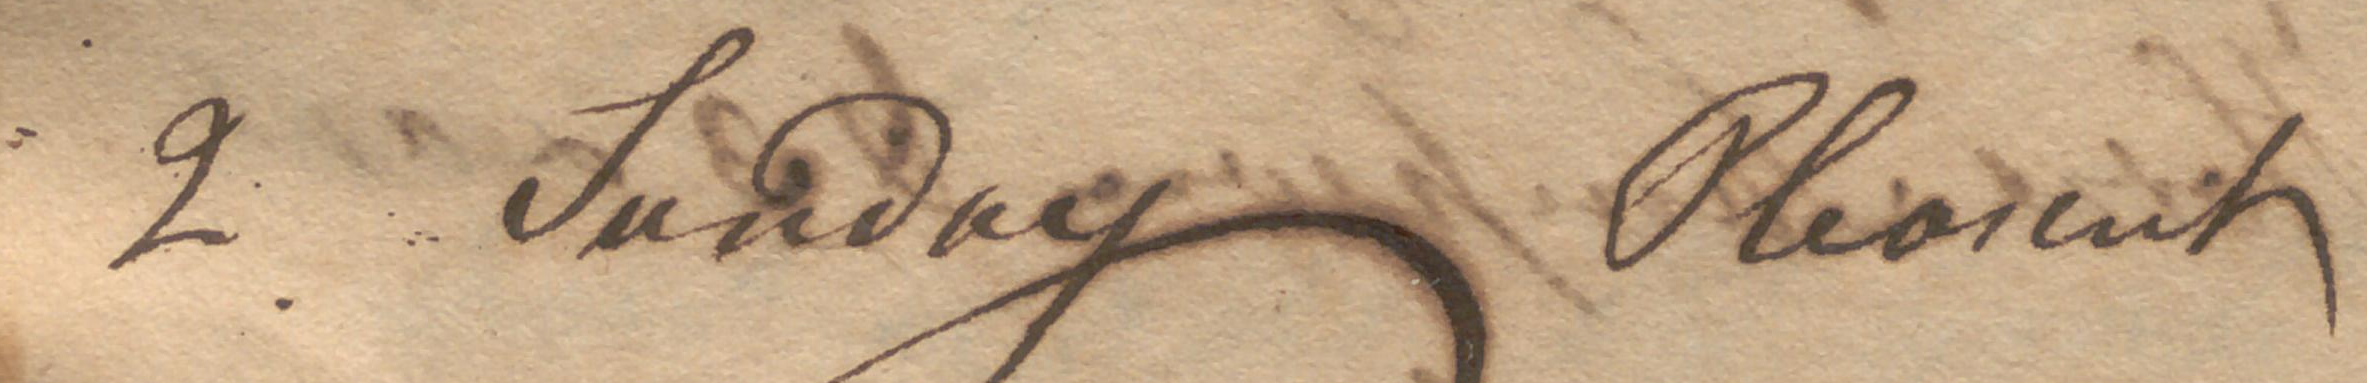2 Sunday Pleasent
